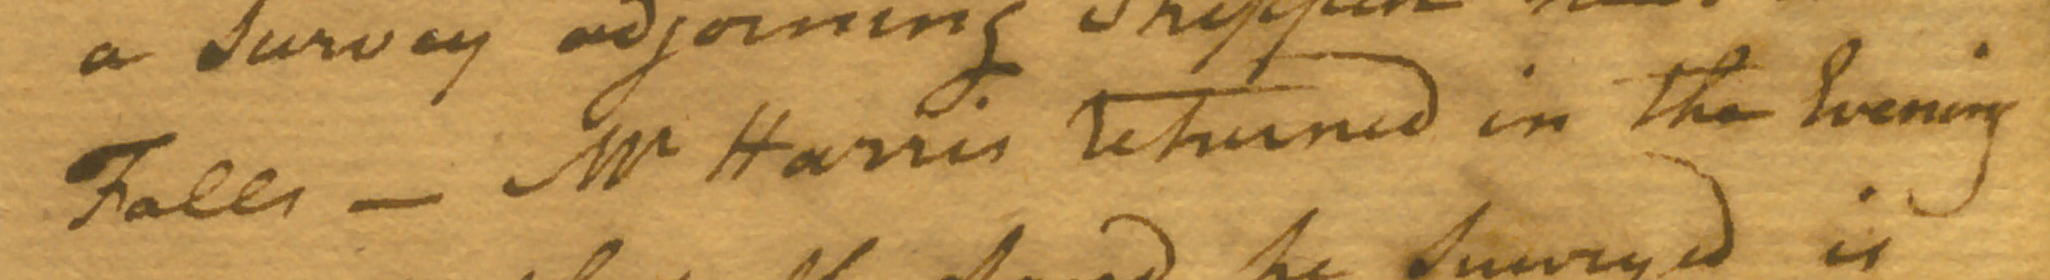Falls- M^r Harris returned in the Evening
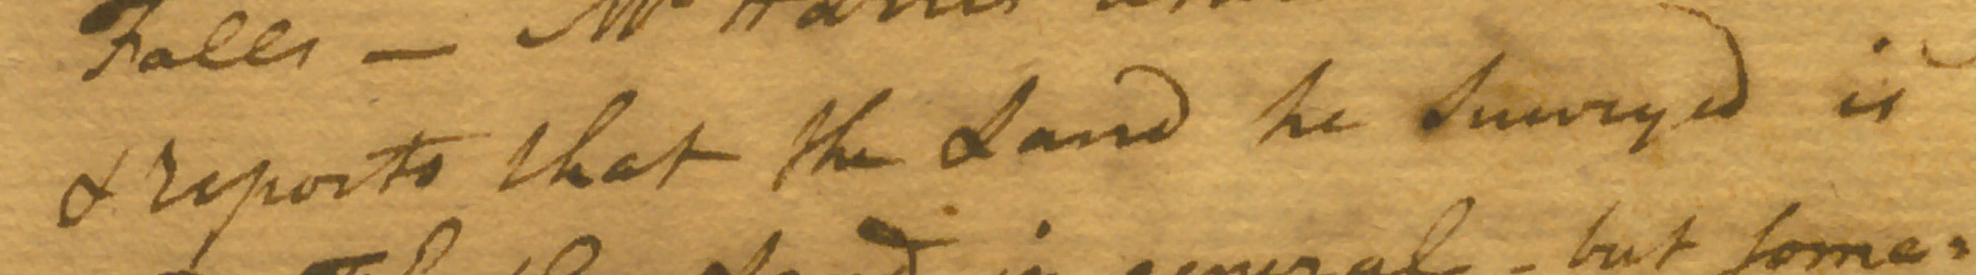& reports that the Land he surveyed is
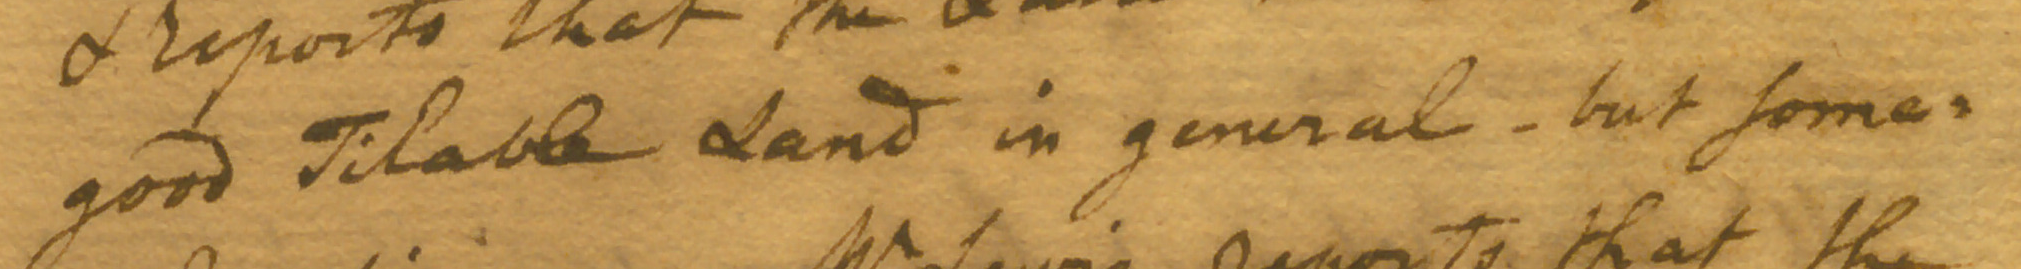good Tilable land in general- but some-
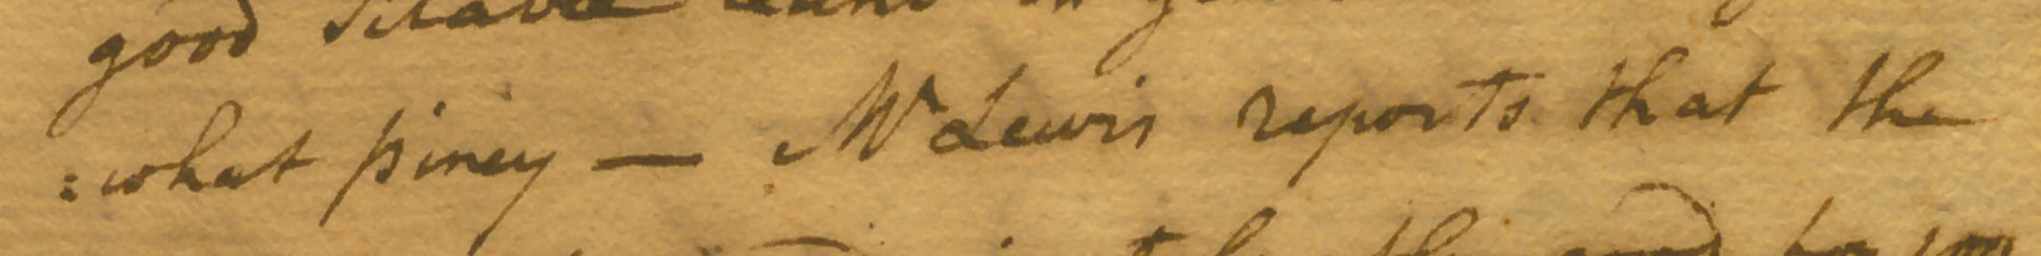-what piney- Mr Lewis reports that the
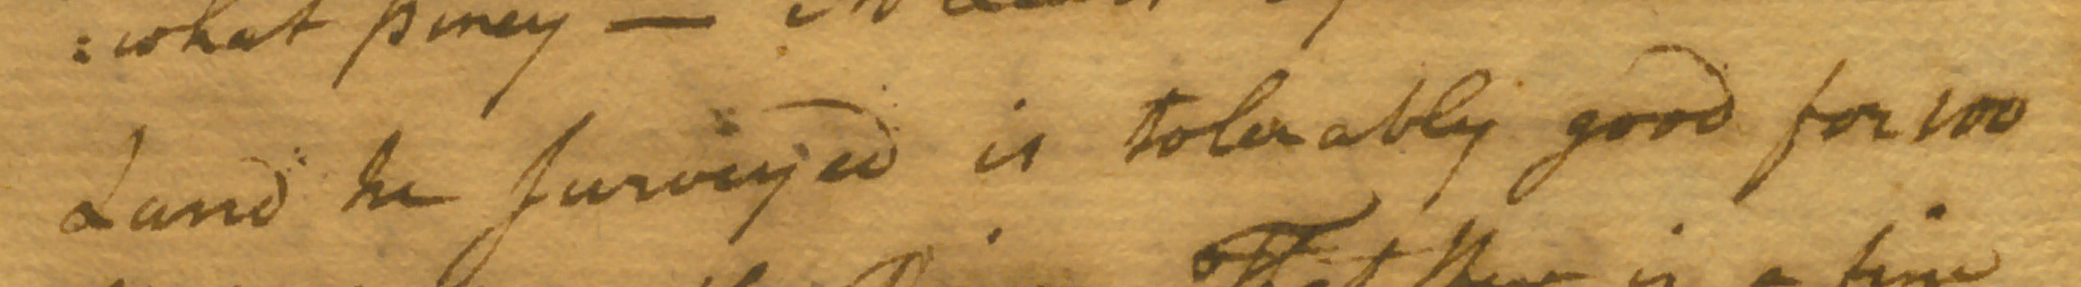Land he surveyed is tolerably good for 100
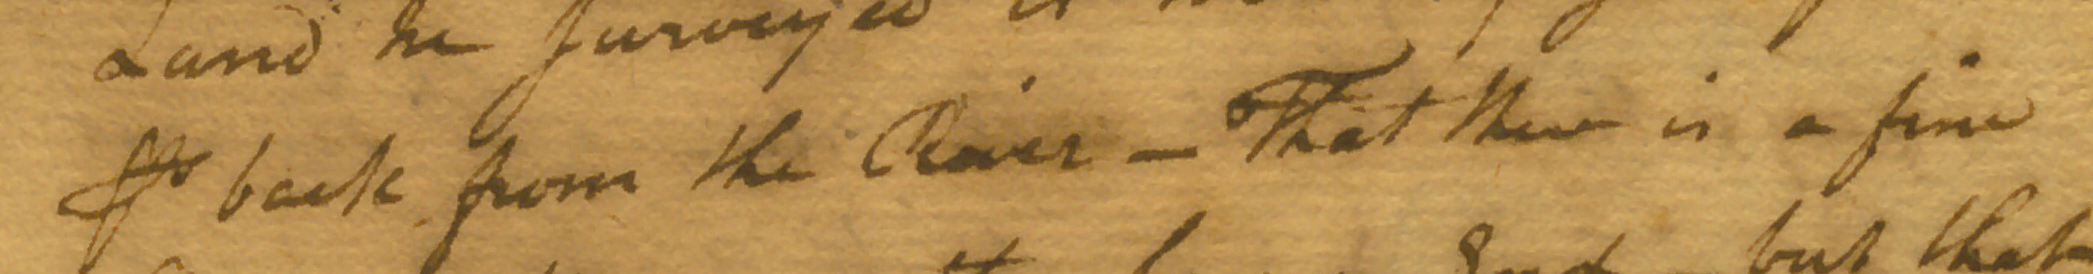per back from the River- That there is a fine
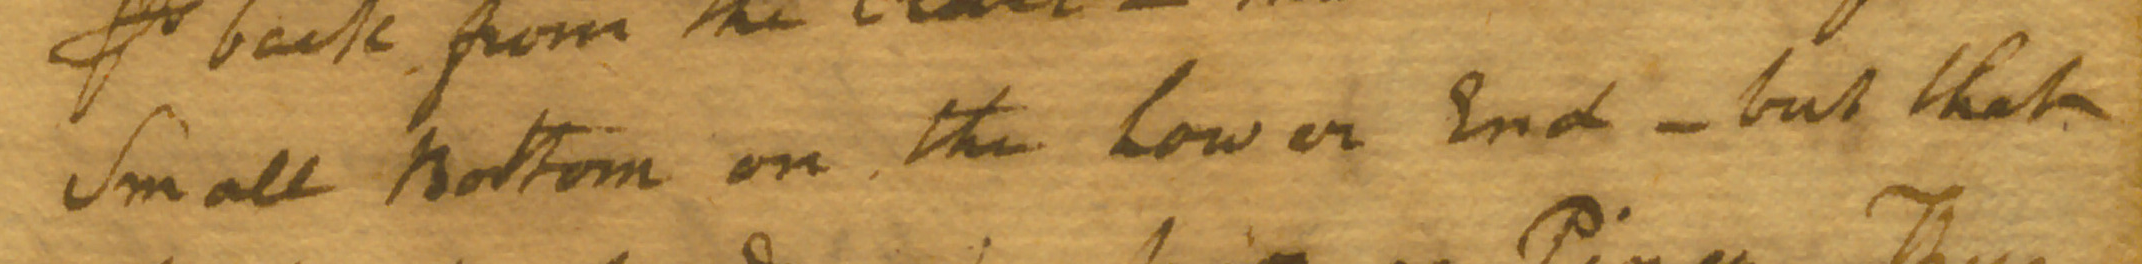small Bottom on the Lower End- but that
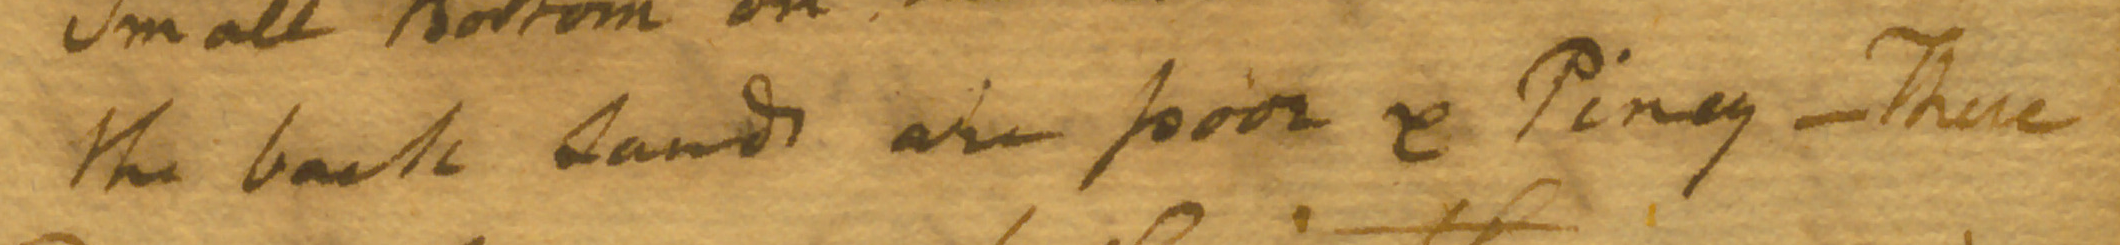the back Lands are poor & piney- These
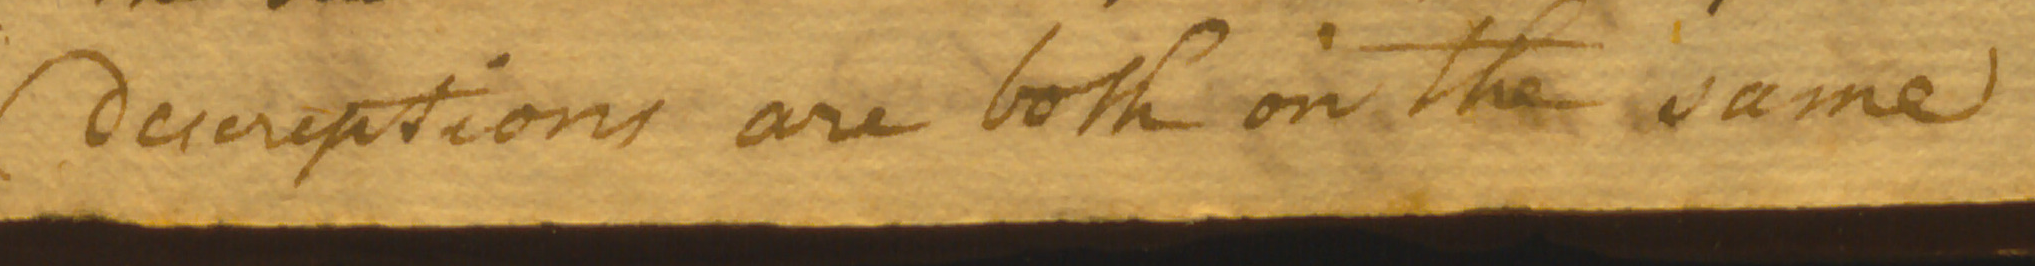descriptions are both on the same
